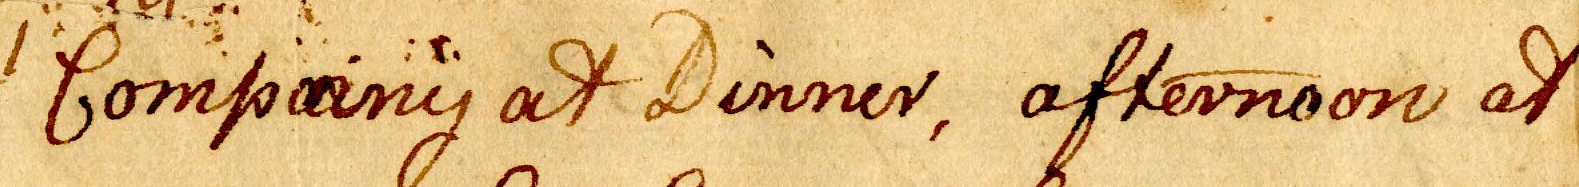Company at Dinner, afternoon at
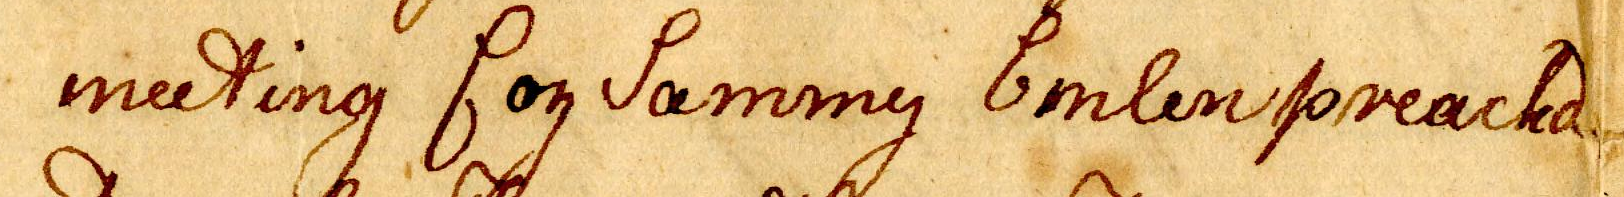meeting Coz Sammy Emlen preachd
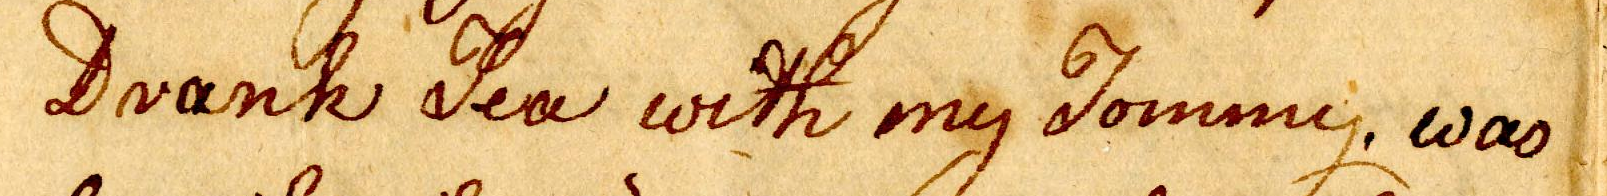Drank Tea with my Tommy, was
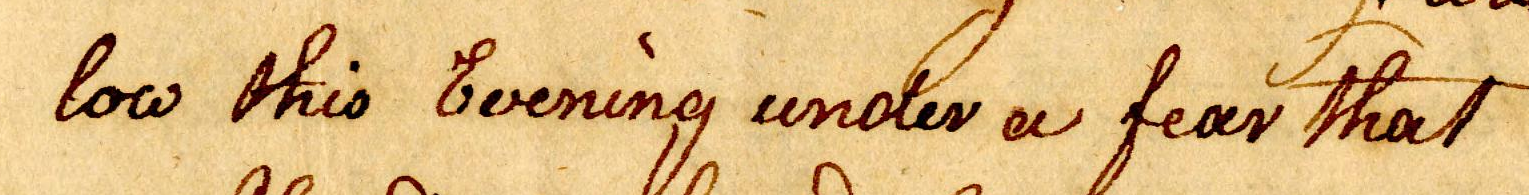low this Evening under a fear that
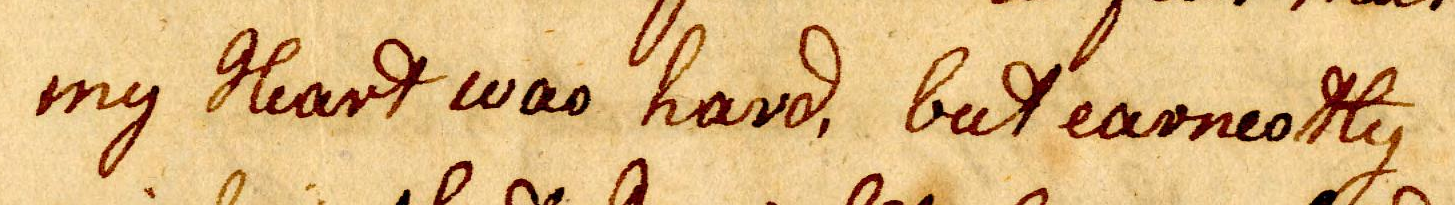my Heart was hard, but earnestly
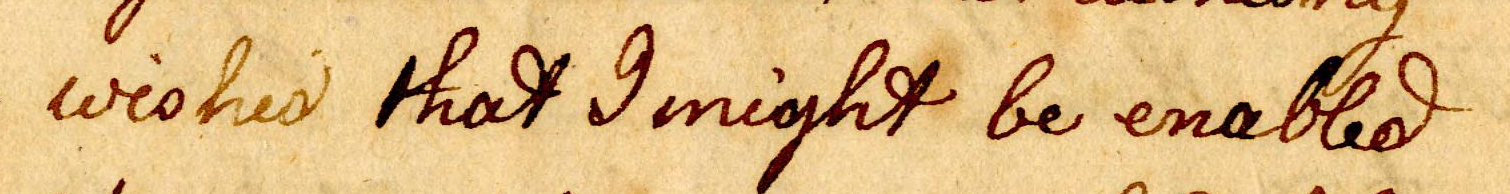wished that I might be enabled
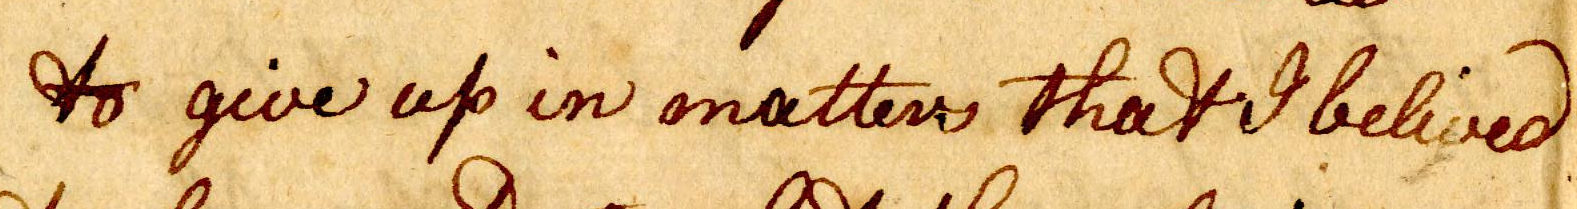to give up in matters that I belived
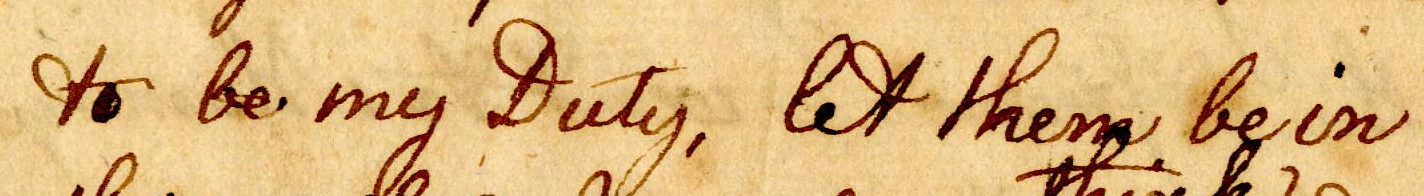to be my Duty, let them be in
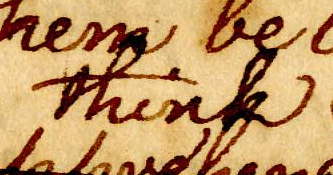think
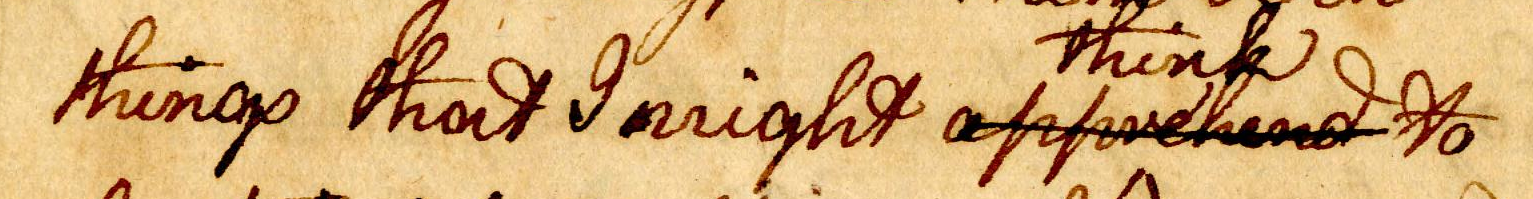things that I might [_________] to
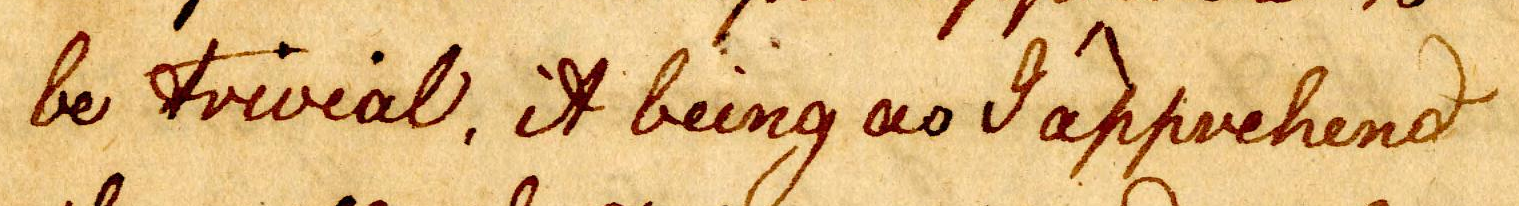be trivial, it being as I apprehend
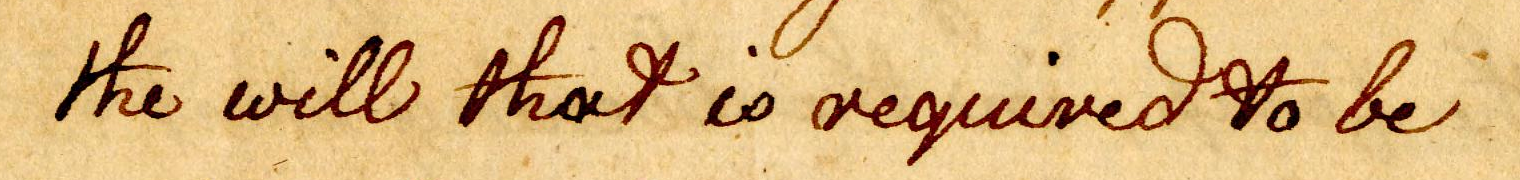the will that is required to be
